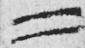二
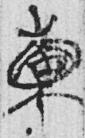{束缶}（包）
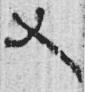又（有）
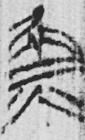魚
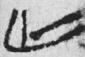亡
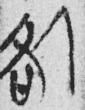咎
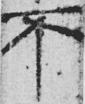不
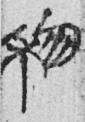利
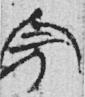{宀万}（賓）
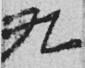九
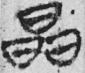晶
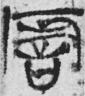誫（臀）
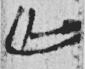亡
